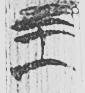王
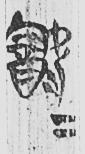酓欠=
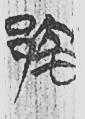○（蔡）
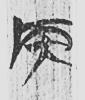侯
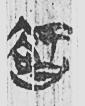智
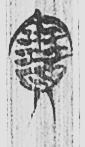賽
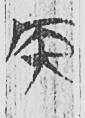侯
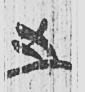之
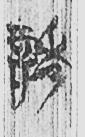誘
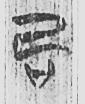{己口}
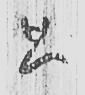也
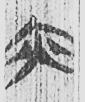亦
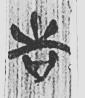告
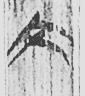文
